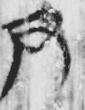尹
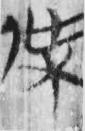傑
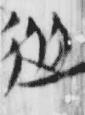從
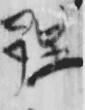郢
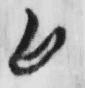㠯（以）
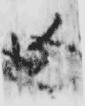此
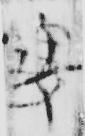等
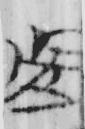○（來）
